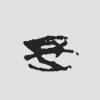是
